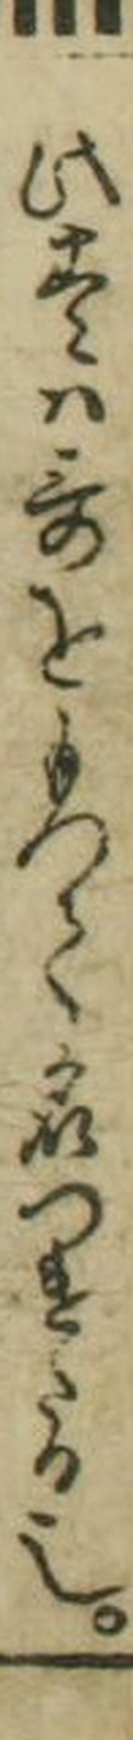此巻は哥をもつて名つけたる也。
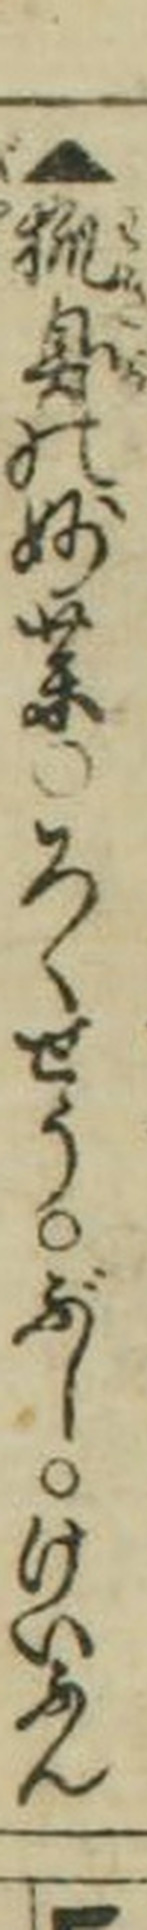▲狐臭の妙薬◯ろくせう○ぶし◯けいふん
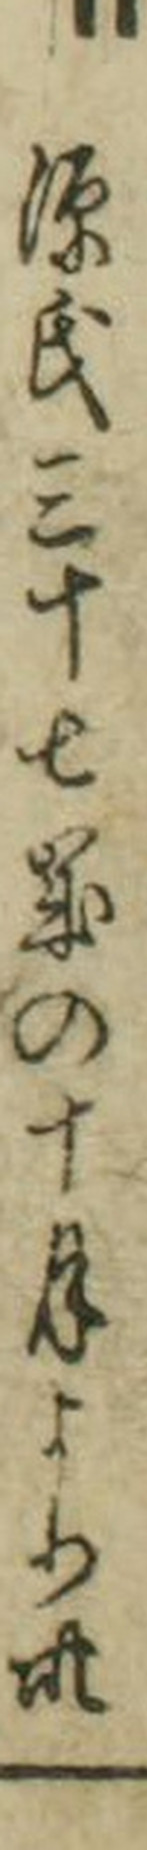源氏三十七歳の十月より卅
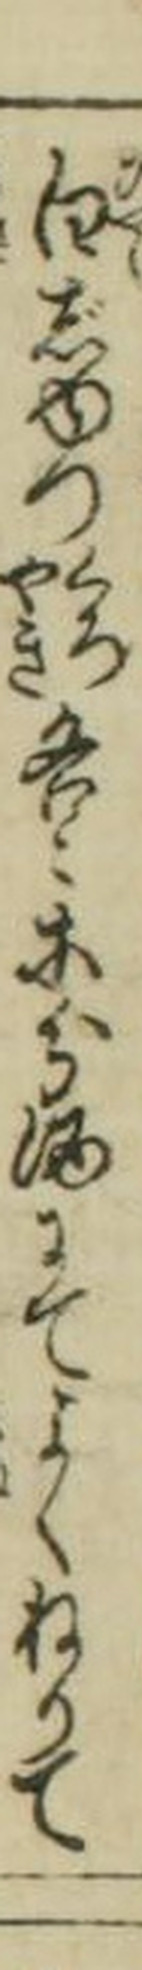白じゆつくろやき各々等分酒にてよくねりて
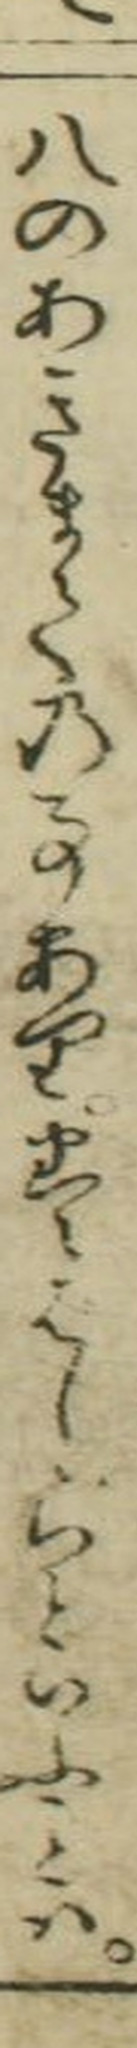八のあきまての事あり。巻はしらといふことは。
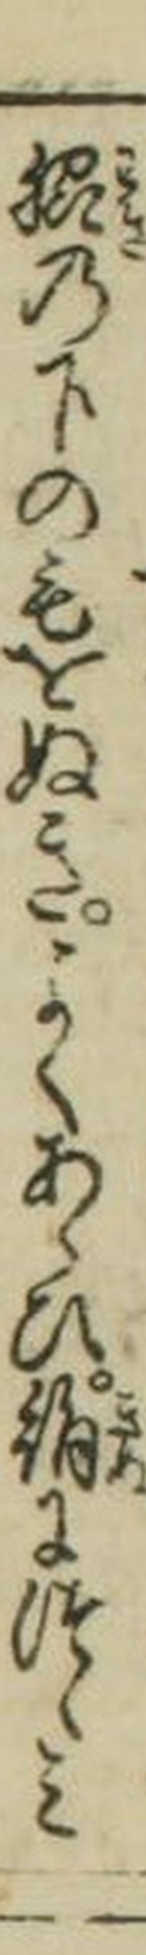脇の下の毛をぬき。よくあらひ。絹につゝみ
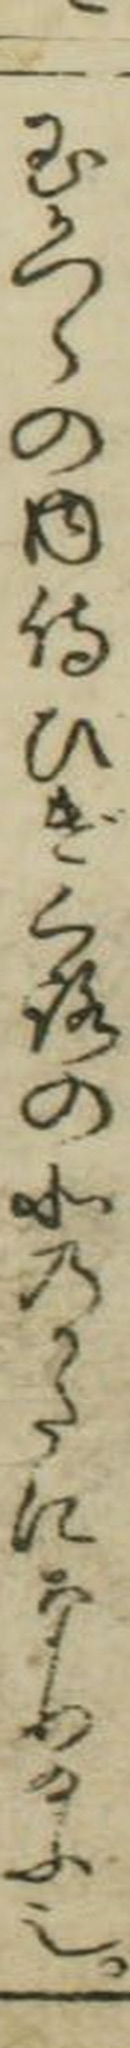玉かつらの内侍ひげくろの北のかたになり給ふ也。
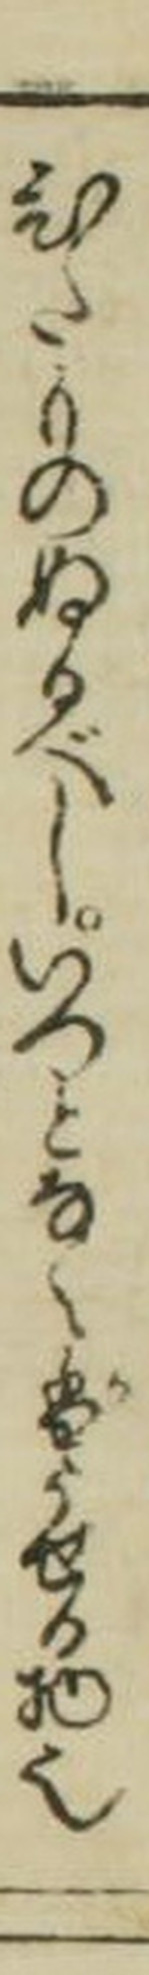ひたものぬるべし。いつとなく香うせる物也
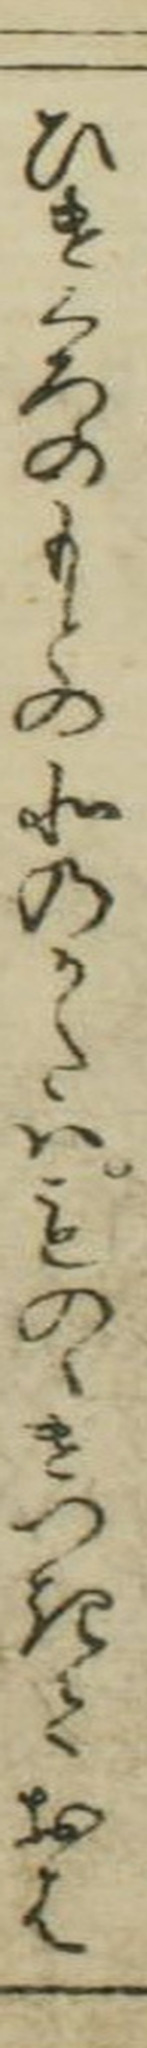ひけくろのもとの北のかたは。ものゝけつきておは
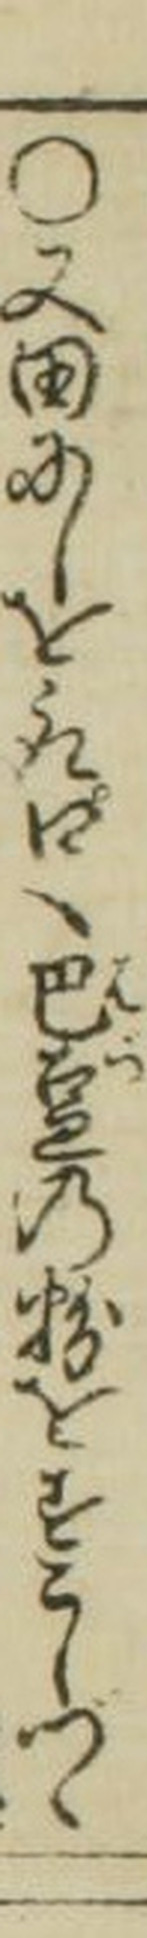◯又田にしを取。口へ巴豆の粉をすこしづゝ
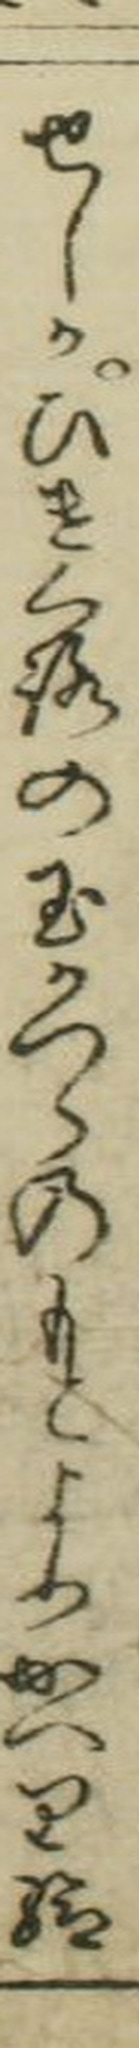せしか。ひけくろの玉かつらのもとよりかへり給
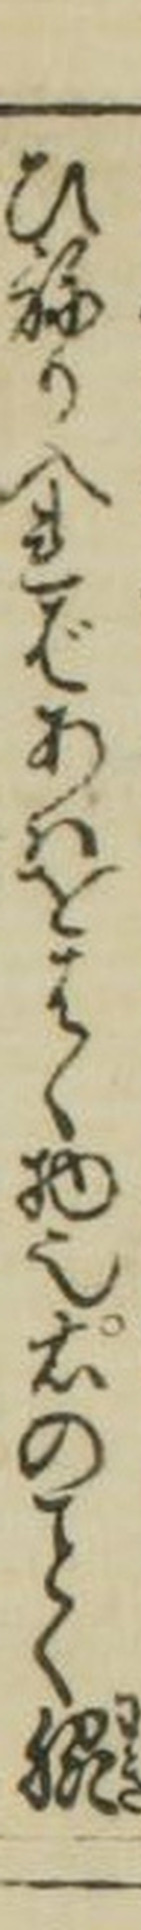ひねり入ればあはをはく物也。右のことく脇
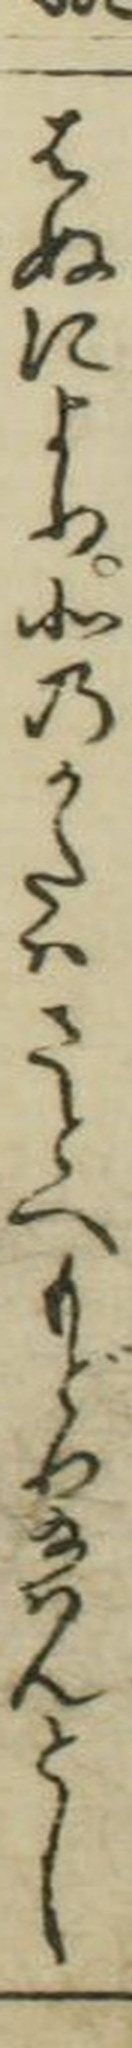はぬにより。北のかたはさとへもどり給はんとし
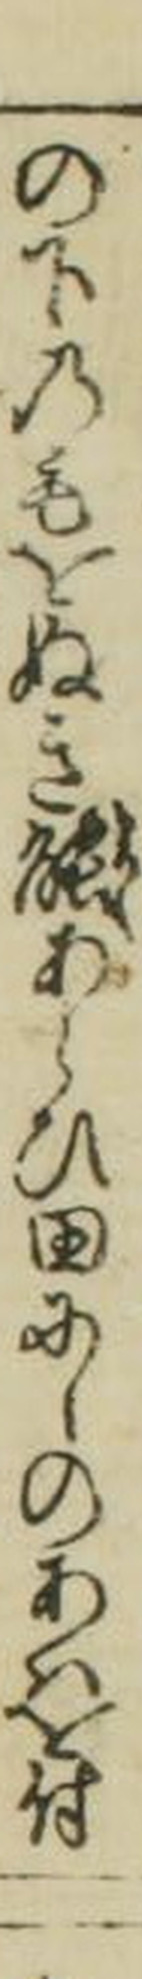の下の毛をぬき能あらひ田にしのあはを付
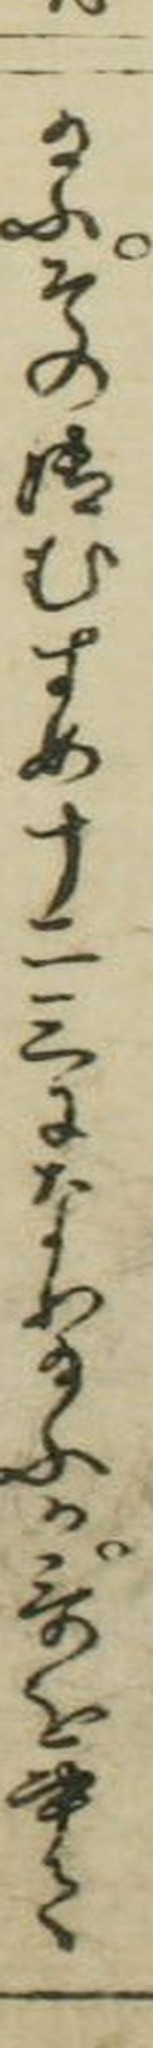給ふ。その御むすめ十二三になり給ふか。哥を書て
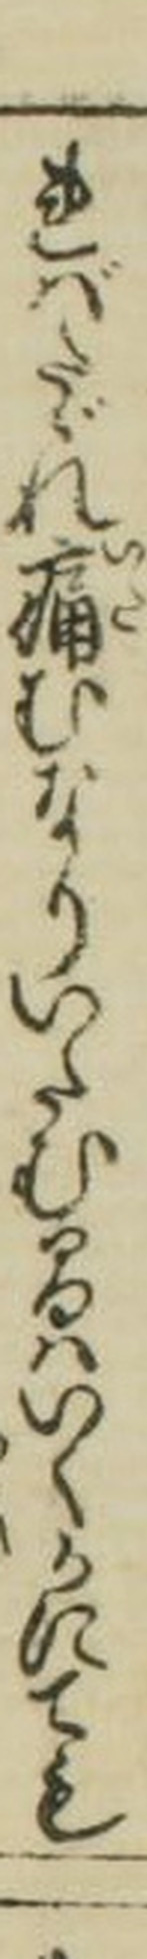ればたゞれ痛むなりいたむ間はいくかにても
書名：女源氏教訓鑑
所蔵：東京学芸大学附属図書館
